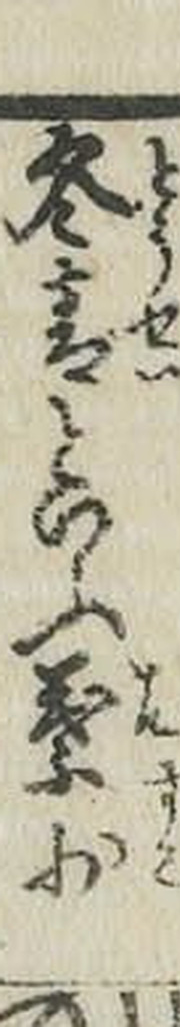冬青といふ葉少

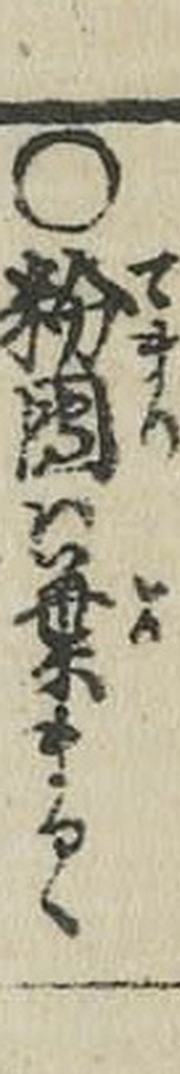○粉団は葉まるく
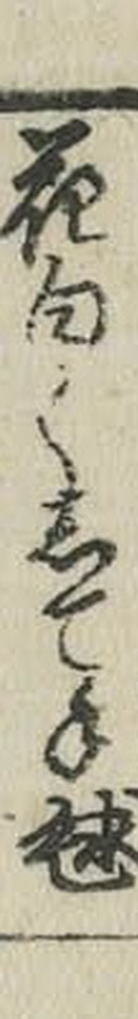花白くして手毬
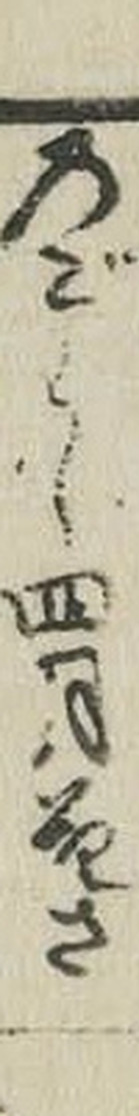のごとし四月花さ
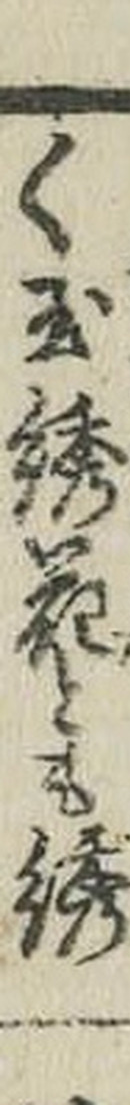く玉繍花とも繍
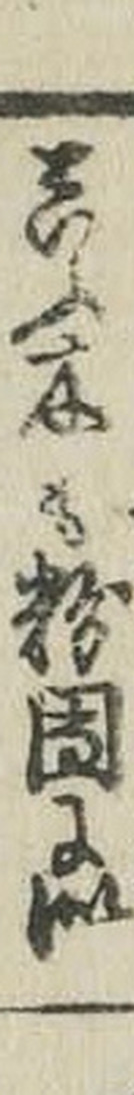といふ木も粉団に似
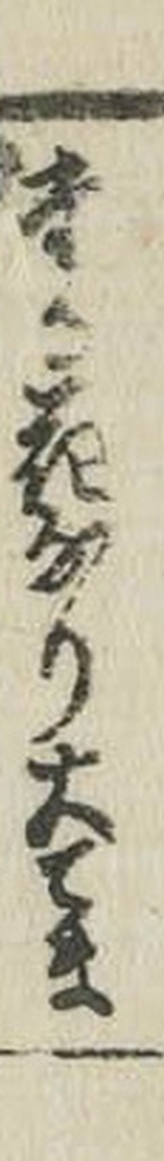たる花なり大てま
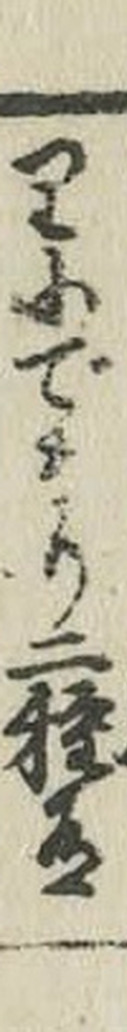り小でまり二種有
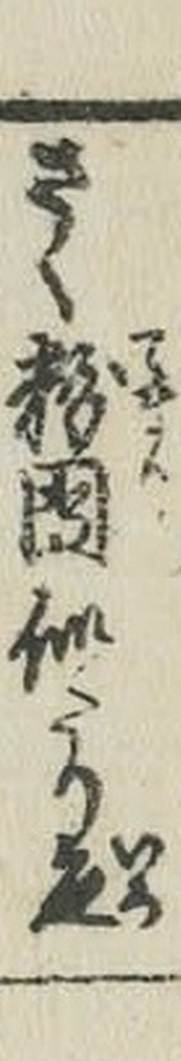さく粉団似たり色
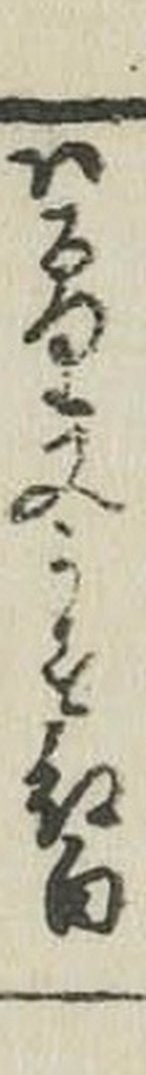はるり又うす紅白
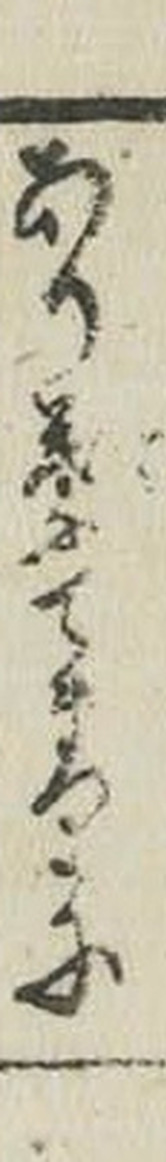あり葉てまりに
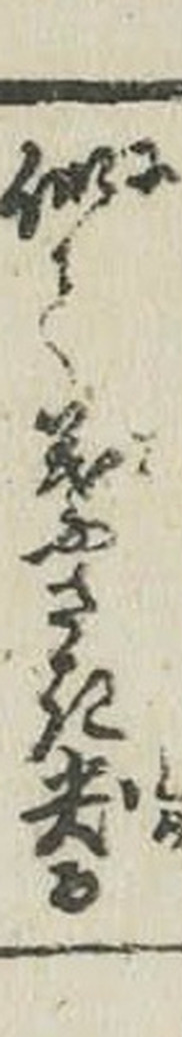似て葉さき尖る
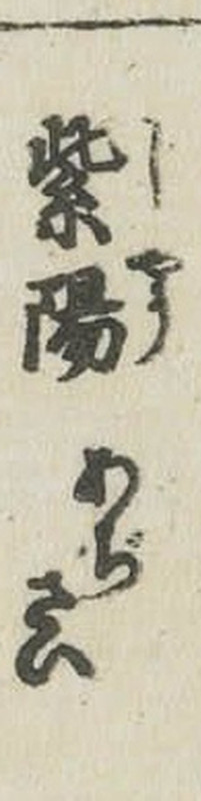紫陽あぢさい
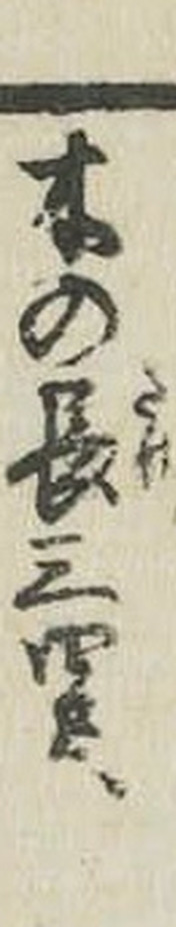木の長三四尺
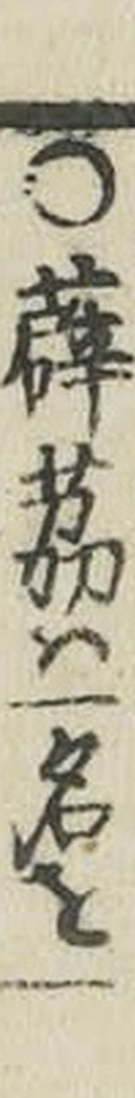○薜荔は一名を
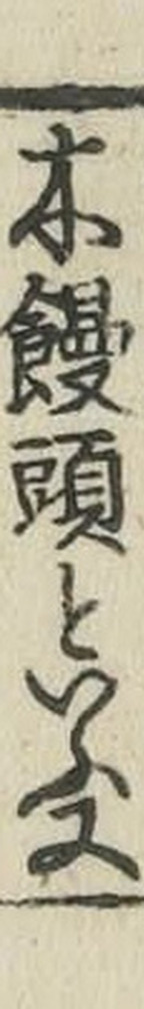木饅頭といふ又
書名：増補頭書訓蒙図彙大成 10巻 8:巻之17-19
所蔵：東京学芸大学教育コンテンツアーカイブ
